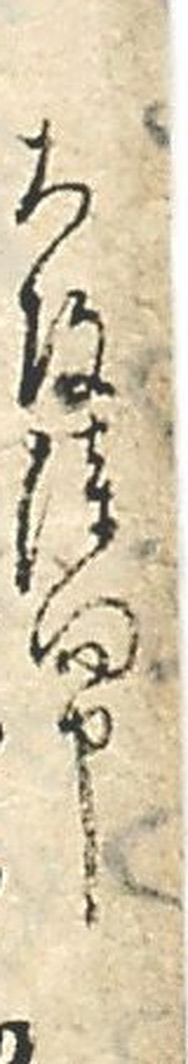大坂漆問中

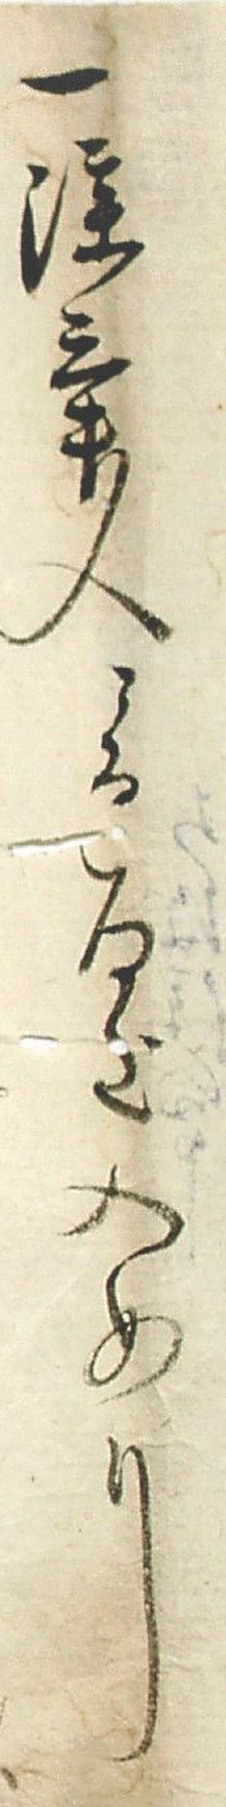一漆三升入に而百匁入め事
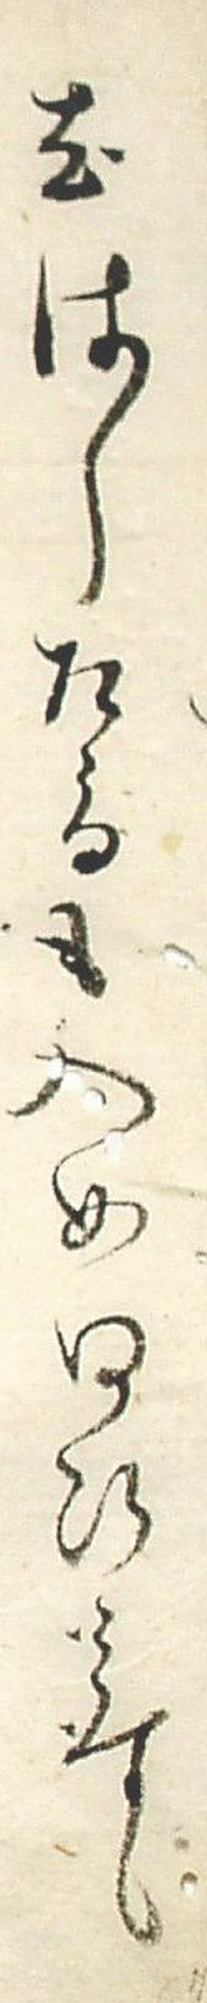尤はしたに而も入め同断御座候
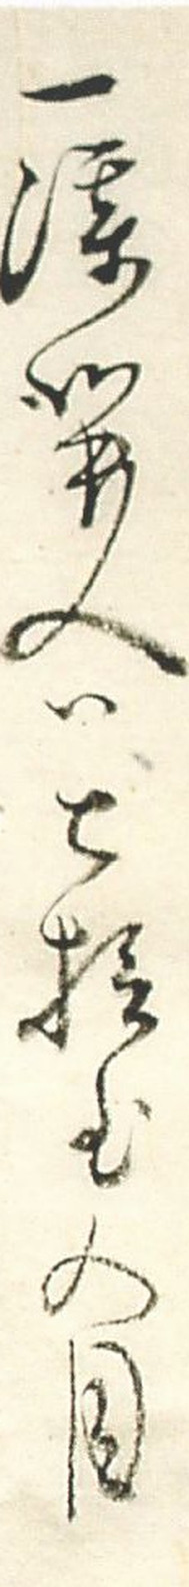一漆弐升入は七拾匁入目
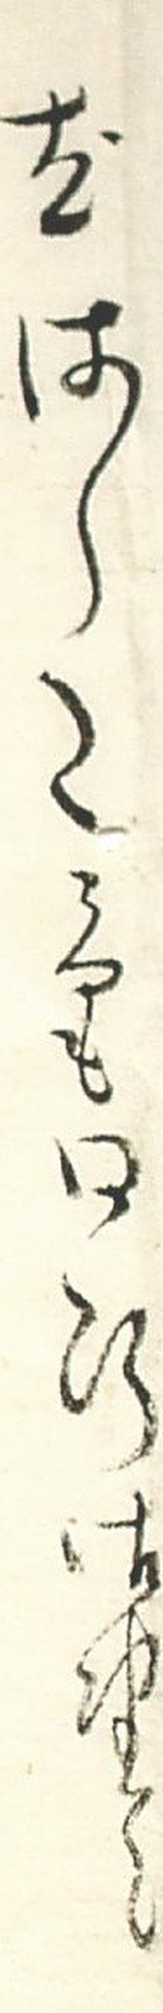尤はしたに而も同断御坐候
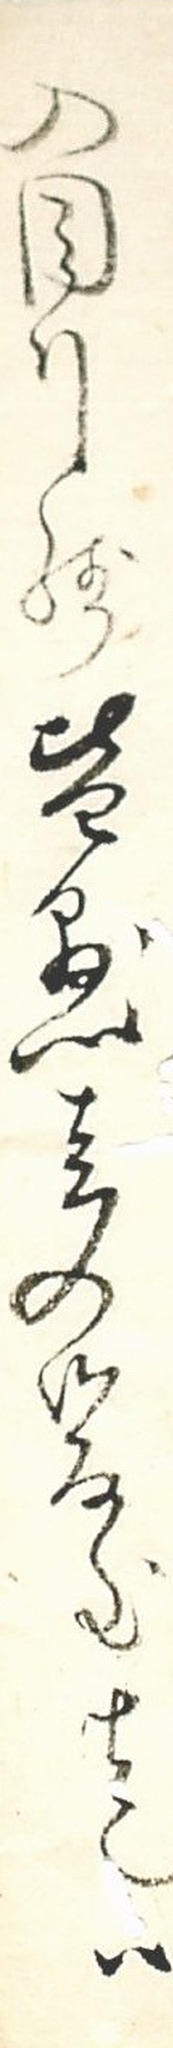入目事残皆懸壱〆弐百匁十疋は
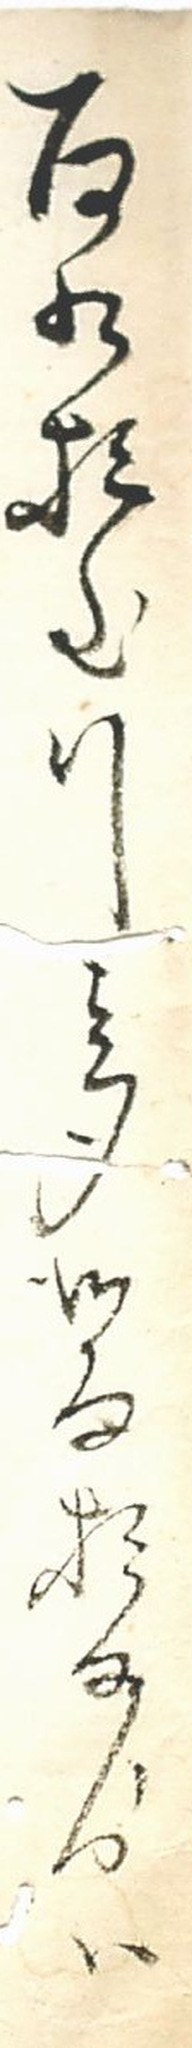百九拾匁事壱〆弐百拾匁ゟは
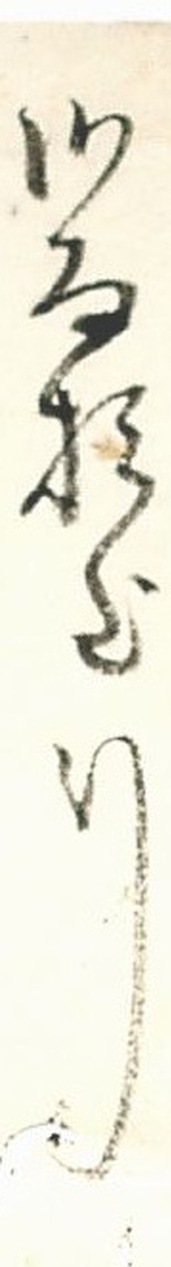弐百拾匁事
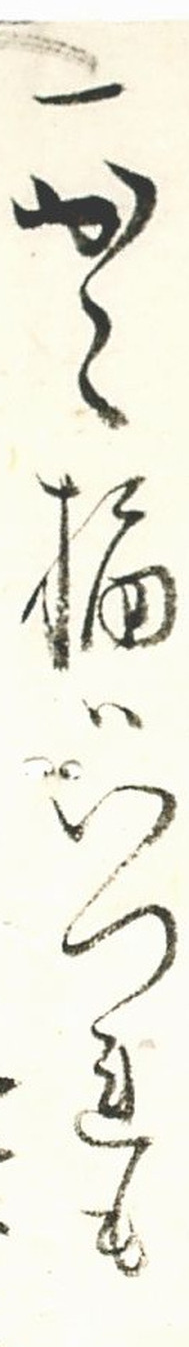一かこ桶はいつれも
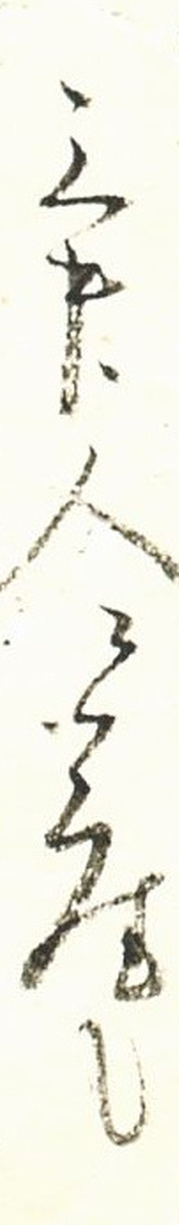三升入に御座候
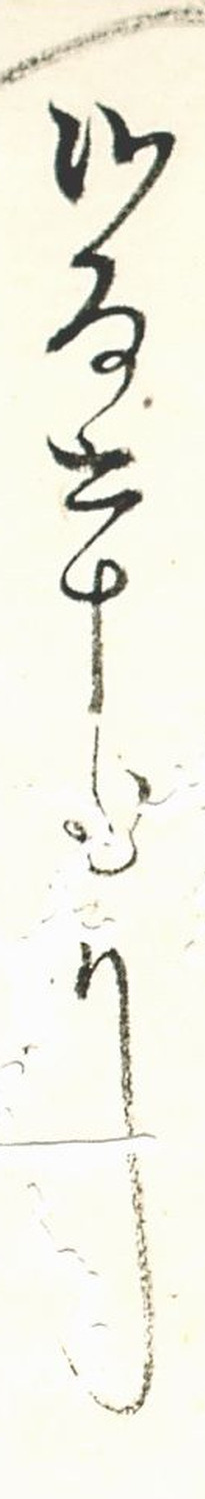弐百六十匁事
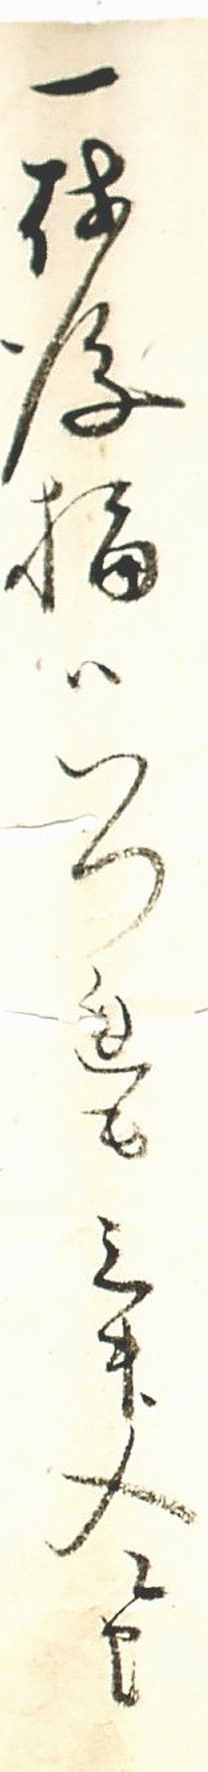一残存桶はいつれも三升入に申候
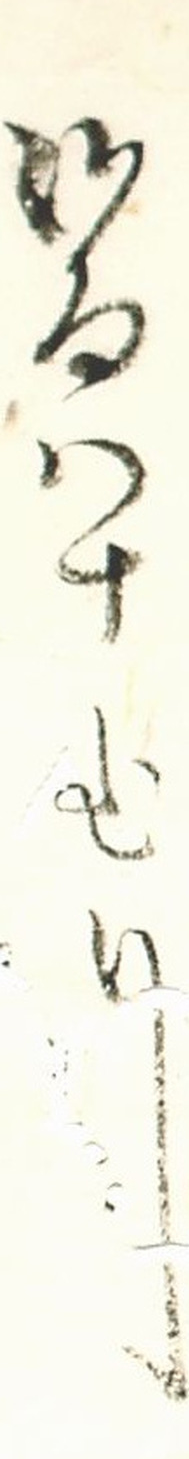弐百八十匁事
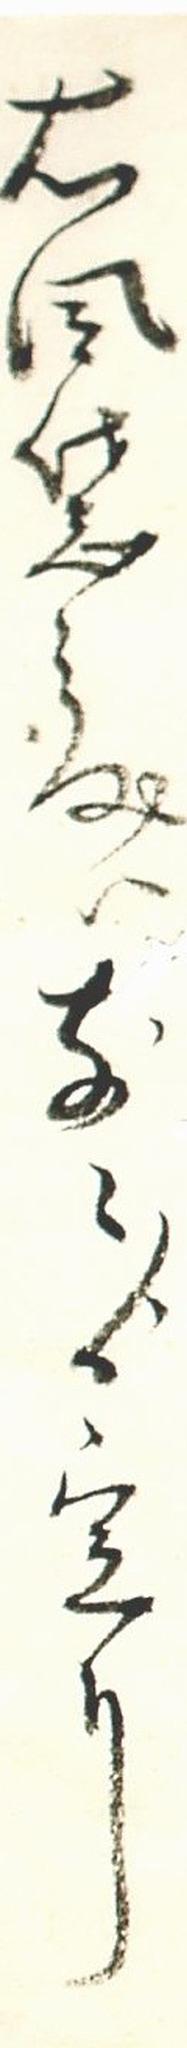右風袋之儀は前々ゟ定事
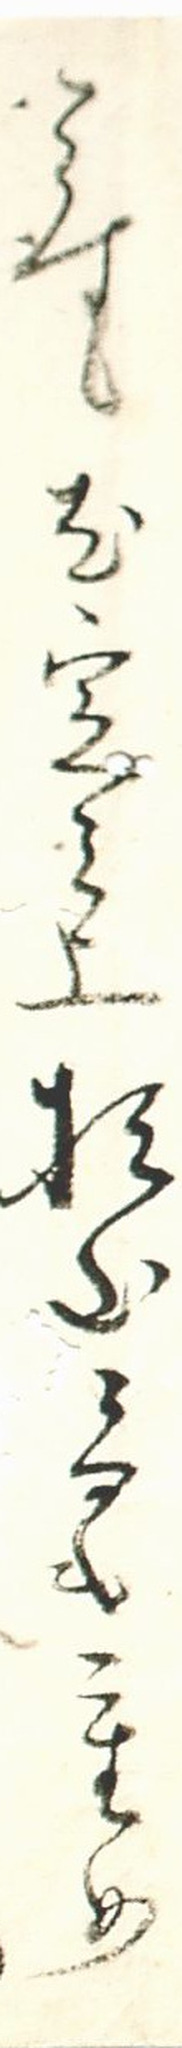御坐候尤定之上拾匁に而も置義
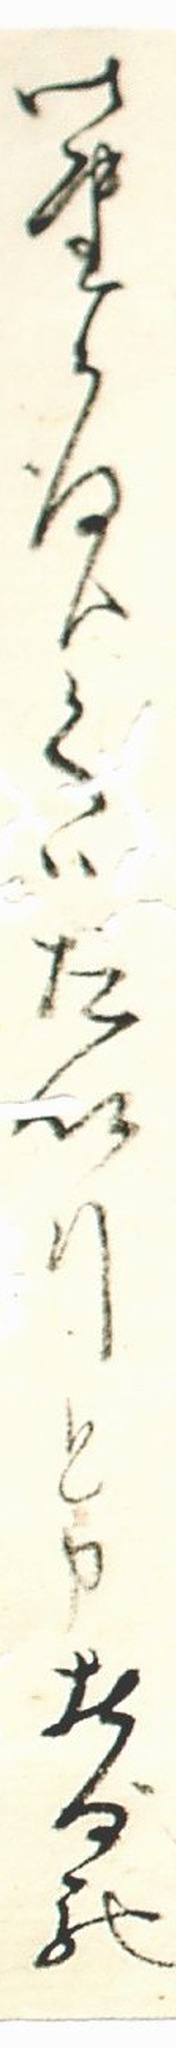御座候得は之はたい引と申居ゟ馳
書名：漆買捌方之事（漆売却約定書）
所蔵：鳴門教育大学 Naruto University of Education
